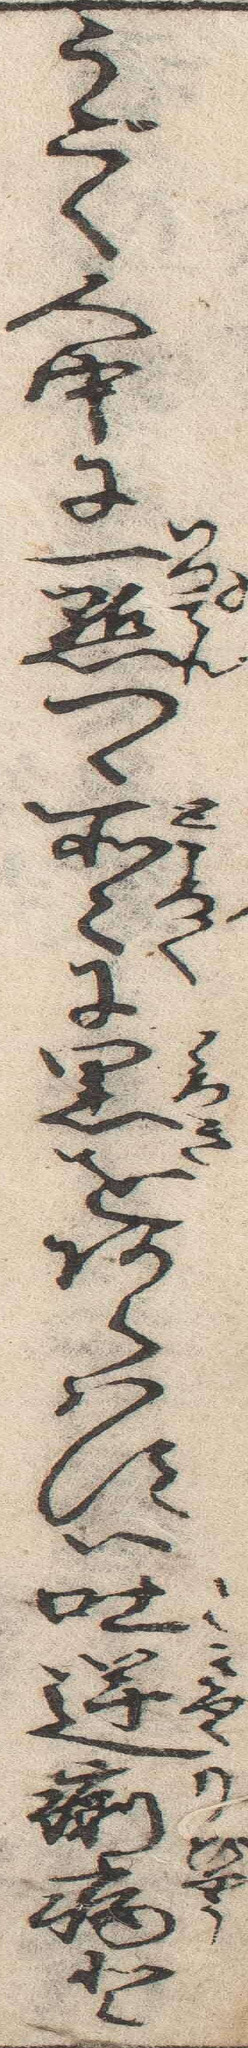うごく人中に一點つゝ所〻に黒をあらはすは吐逆痢病と
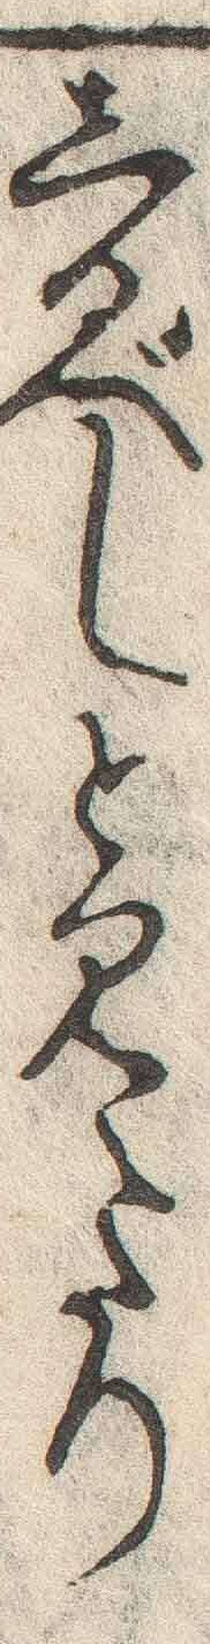しるべしと見えたり
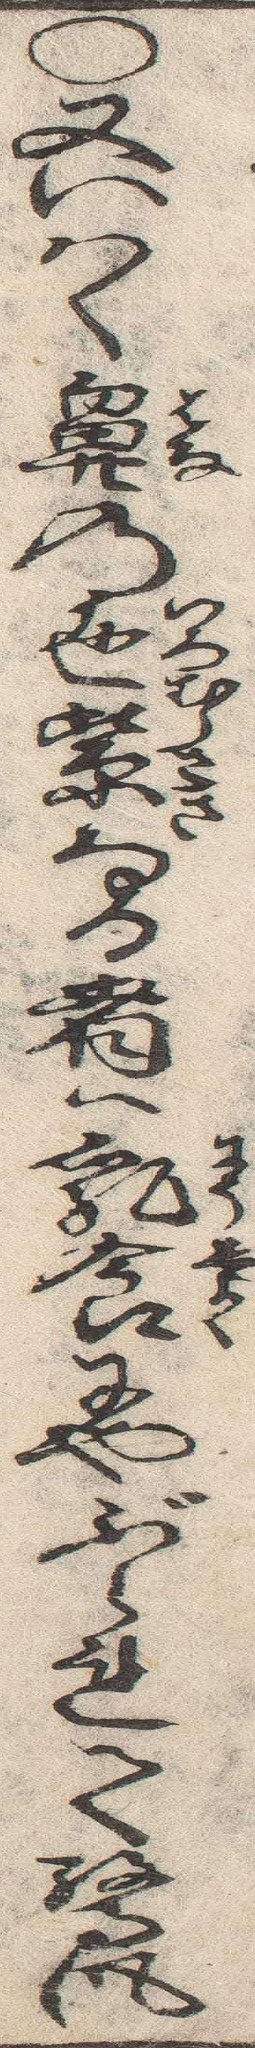◯又いはく鼻の色紫なる者は乳食にやぶられて驚風
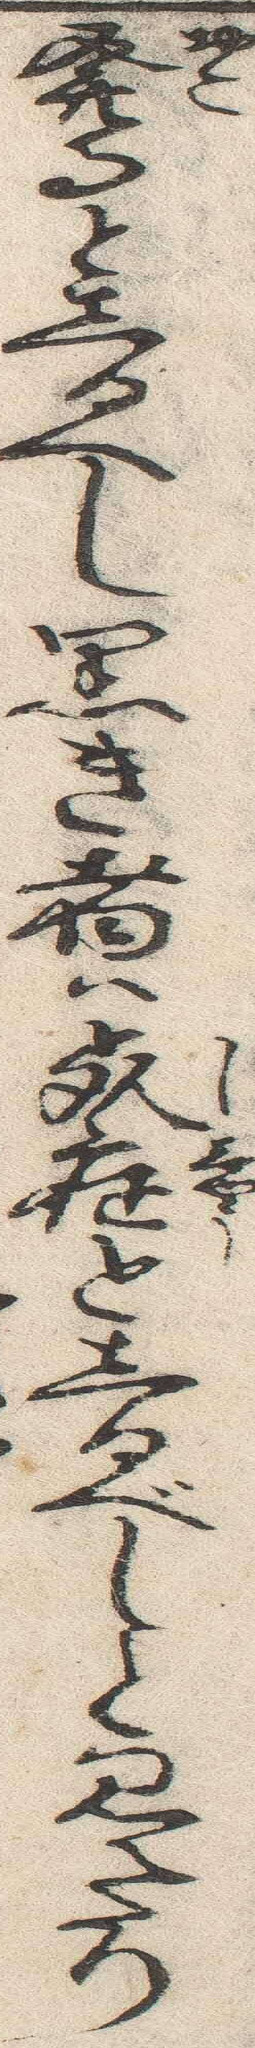発るとしるへし黒き者は死症としるべしと見えたり
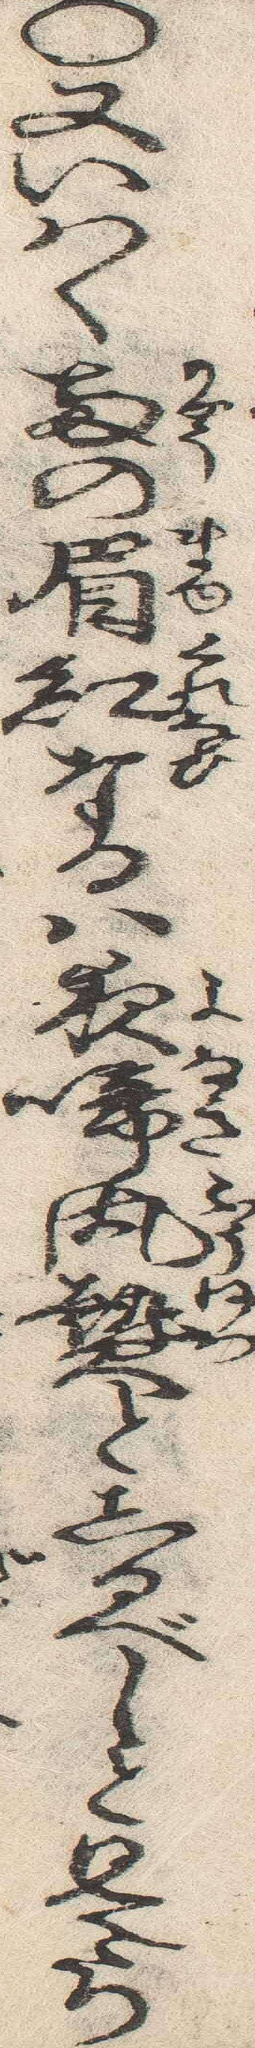◯又いはく両の眉紅なるは夜啼風𤍽としるべしと見えたり
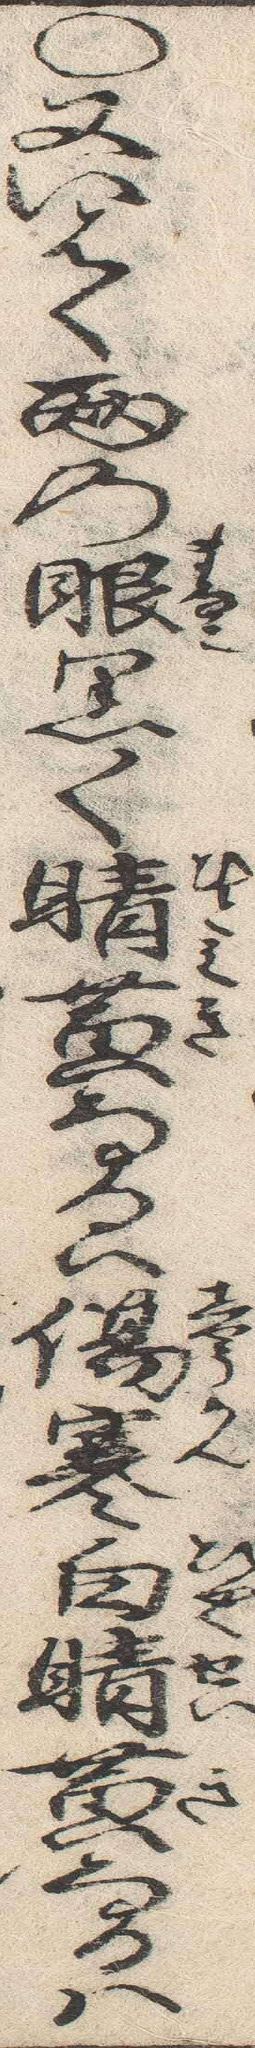◯又いはく両の眼黒く睛黄なるは傷寒白睛黄なるは
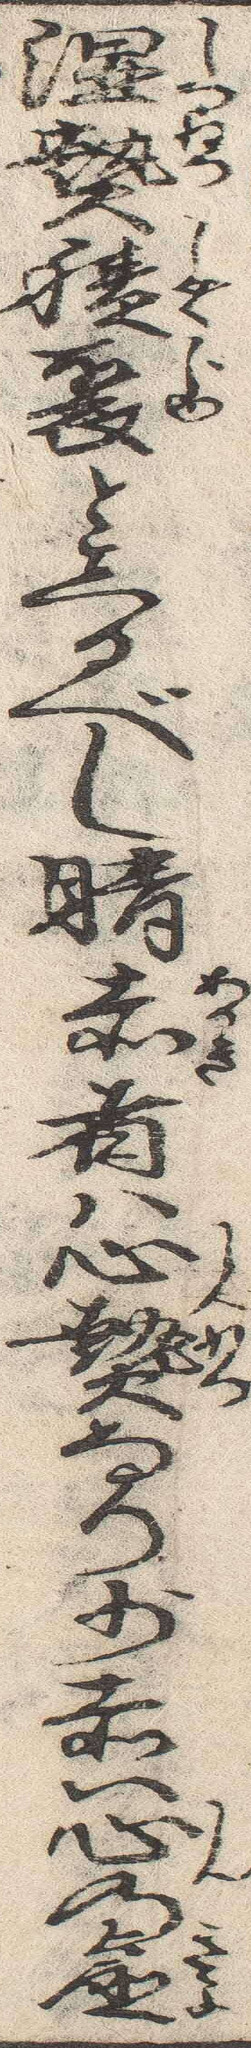湿𤍽積聚としるべし睛赤者は心𤍽なり少赤い心の虚
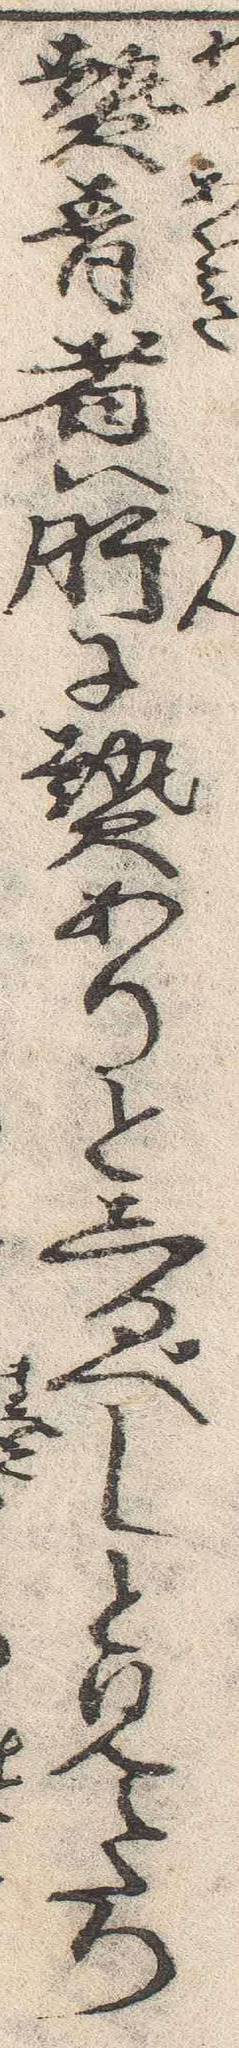𤍽青者は肝に𤍽ありとしるべしと見えたり
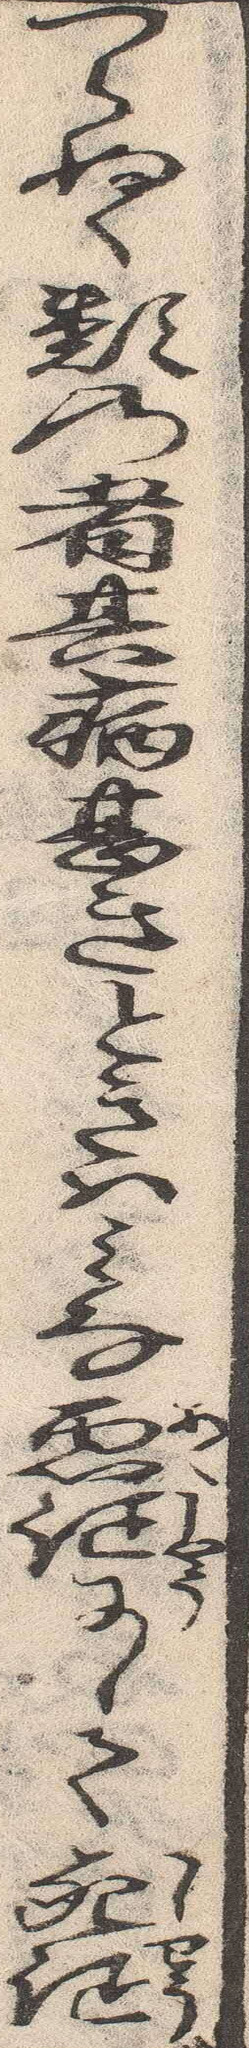つらぬく影の者其病甚きときはみな悪証にして死証
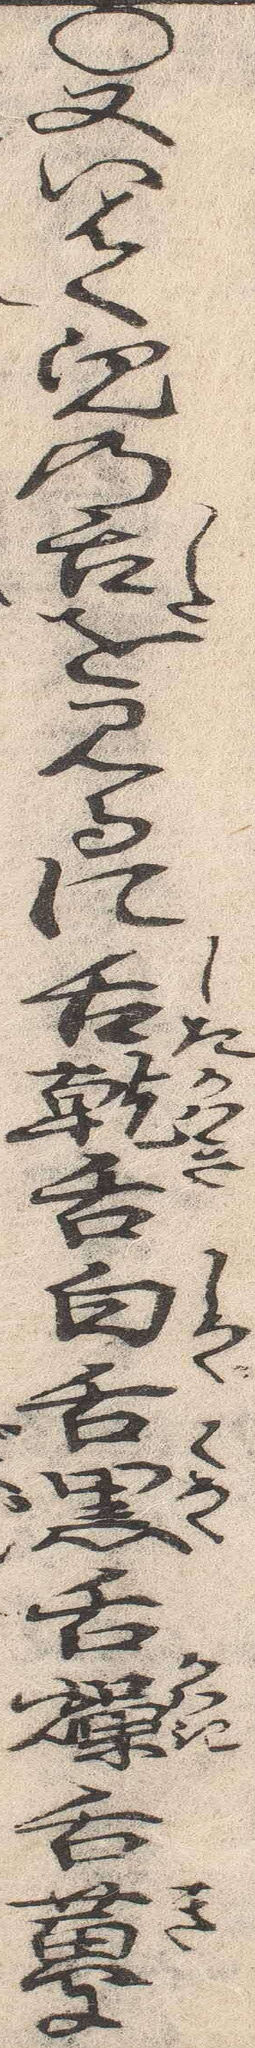◯又いはく児の舌を見るに舌乾舌白舌黒舌燥舌黄に
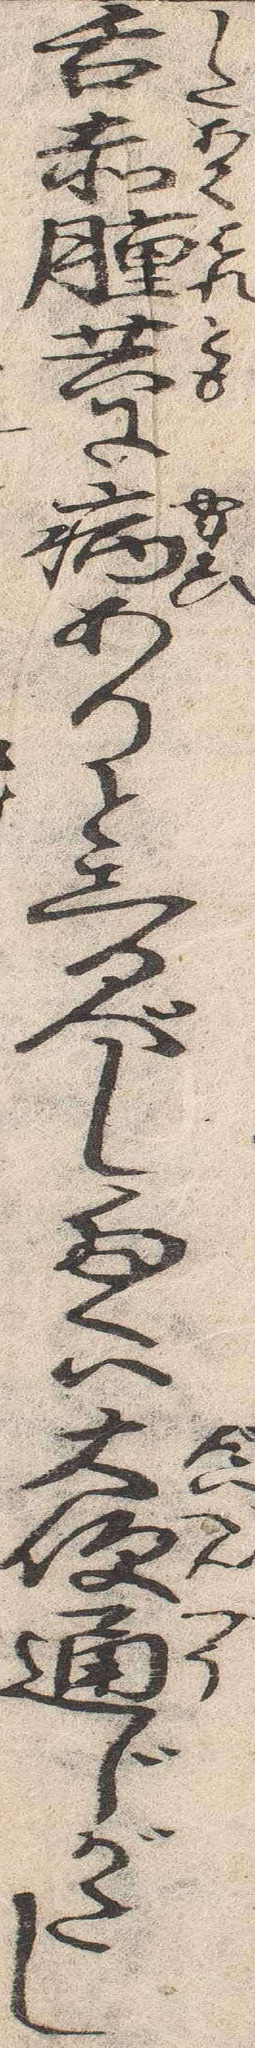舌赤腫共に病ありとしるべし多くは大便通じがたし
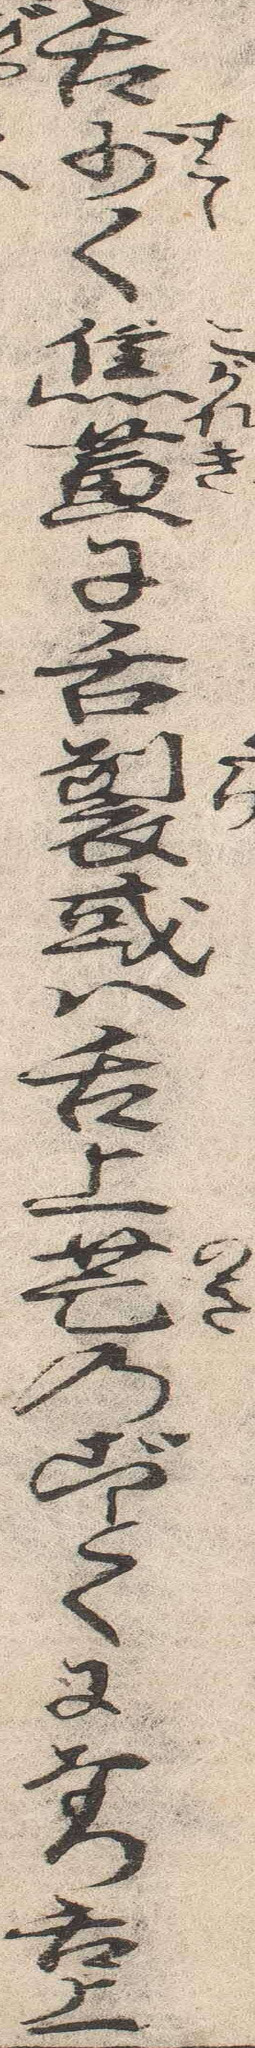舌少く焦黄に舌裂或は舌上芒のごとくになり舌上
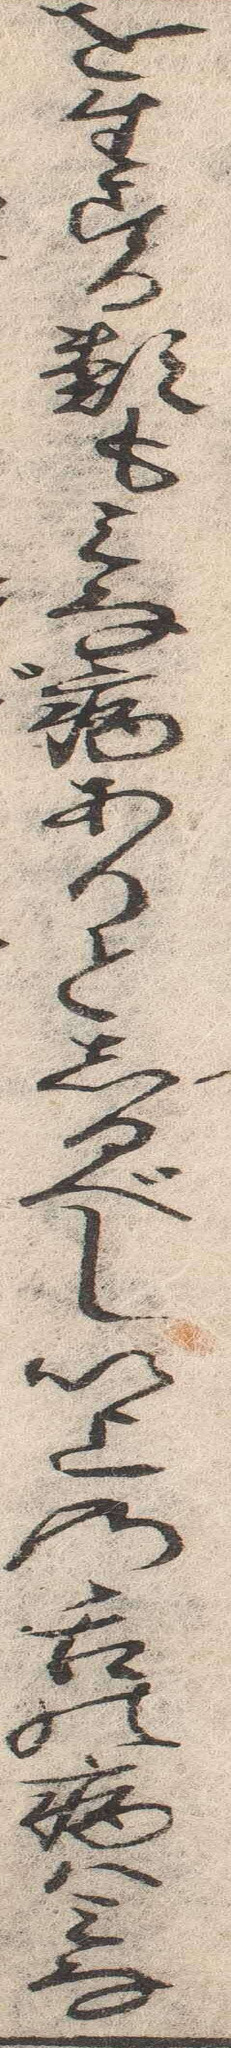を生する類もみな病ありとしるべし以上の舌の病はみな
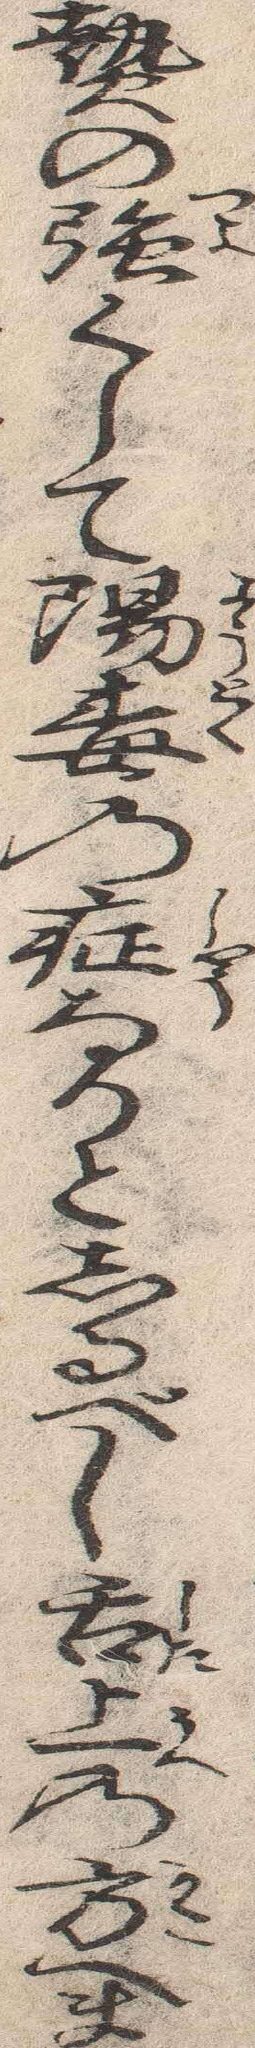𤍽の強くして陽毒の症なりとしるべし舌上の方へま
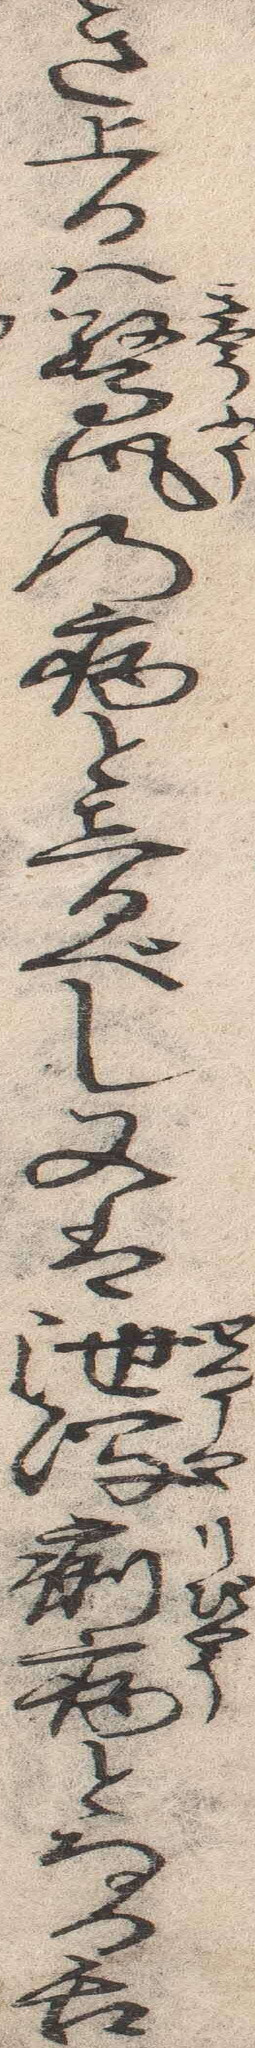き上るは驚風の病としるべし又は泄瀉痢病となる舌
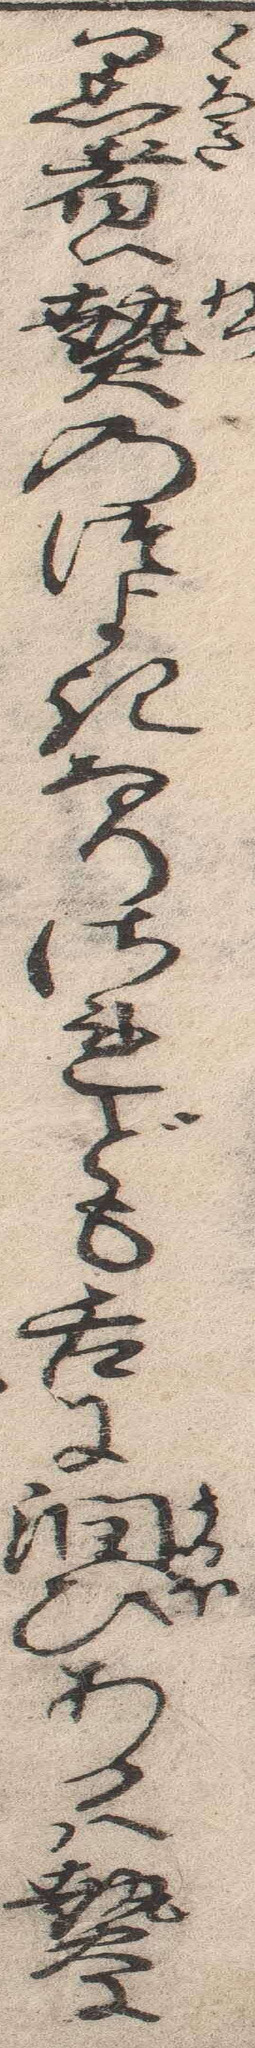黒者は𤍽のつよきなりされども舌に潤いひあるは𤍽に
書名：小児必用養育草
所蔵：東京学芸大学附属図書館 国文学研究資料館
